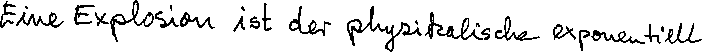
Eine Explosion ist der physikalische exponentiell
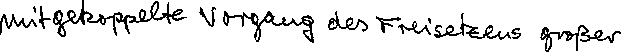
mitgekoppelte Vorgang des Freisetzens großer
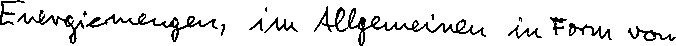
Energiemengen, im Allgemeinen in Form von
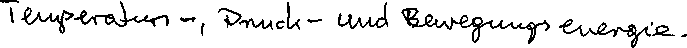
Temperatur-, Druck- und Bewegungsenergie.
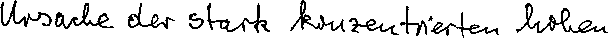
Ursache der stark konzentrierten hohen
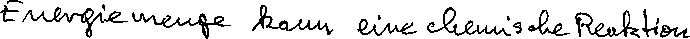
Energiemenge kann eine chemische Reaktion
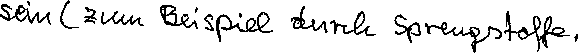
sein (zum Beispiel durch Sprengstoffe,
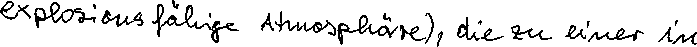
explosionsfähige Atmosphäre), die zu einer in
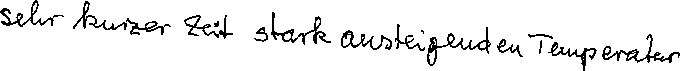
sehr kurzer Zeit stark ansteigenden Temperatur
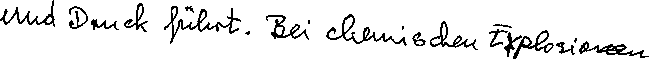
Und Druck führt. Bei chemischen Explosionen
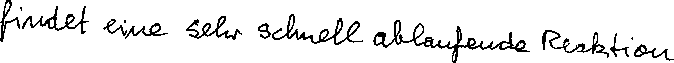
findet eine sehr schnell ablaufende Reaktion
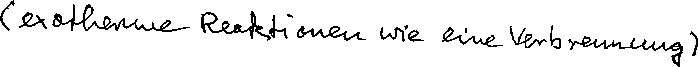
(exotherme Reaktionen wie eine Verbrennung)
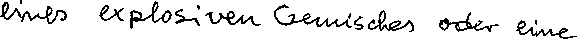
eines explosiven Gemisches oder eine
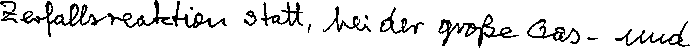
Zerfallsreaktion statt, bei der große Gas- und
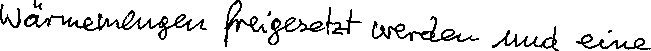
Wärmemengen freigesetzt werden und eine
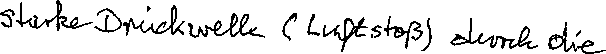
starke Druckwelle (Luftstoß) durch die
